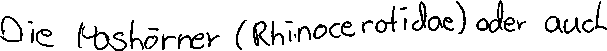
Die Nashörner (Rhinocerotidae) oder auch
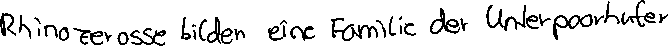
Rhinozerosse bilden eine Familie der Unpaarhufer
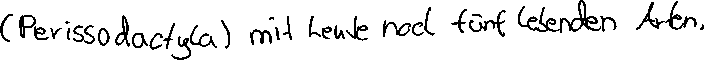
(Perissodactyla) mit heute noch fünf lebenden Arten.
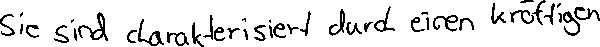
Sie sind charakterisiert durch einen kräftigen
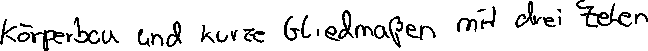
Körper und kurze Gliedmaßen mit drei Zehen
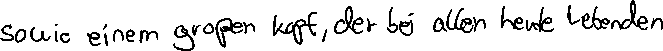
sowie einen großen Kopf, der bei allen heute lebenden
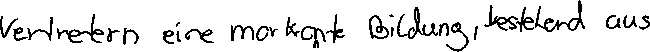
Vertretern eine markante Bildung, bestehend aus
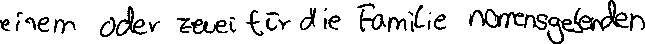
einem oder zwei für die Familie namensgebenden
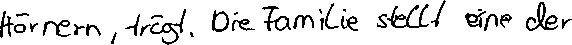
Hörnern, trägt. Die Familie stellt eine der
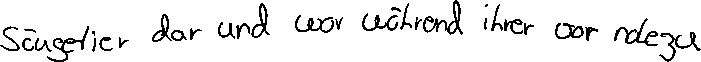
Säugetiere dar und war während ihrer vor nahezu
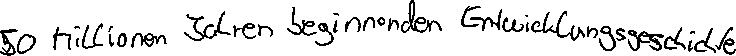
50 Millionen Jahren beginnenden Entwicklungsgeschichte
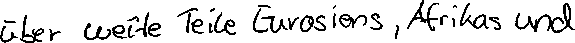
über weite Teile Eurasiens, Afrikas und
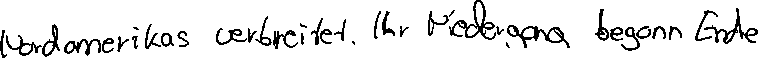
Nordamerikas verbreitet. Ihr Niedergang begann Ende
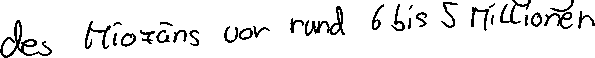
es Miozäns vor rund 6 bis 5 Millionen
